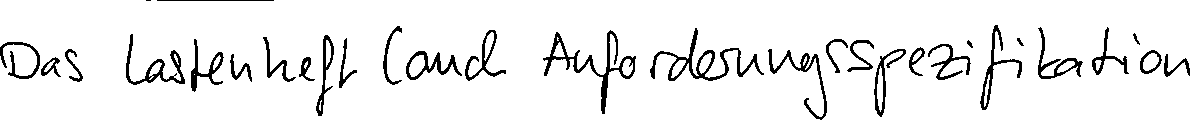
Das Lastenheft (auch Anforderungsspezifikation
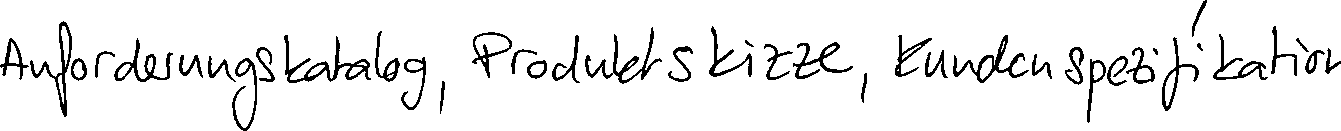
Anforderungskatalog, Produktskizze, Kundenspezifikation
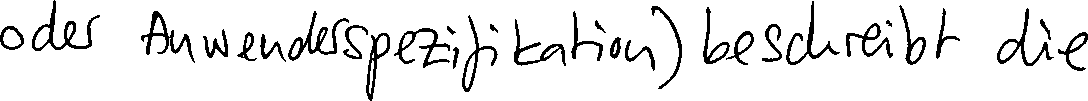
oder Anwenderspezifikation) beschreibt
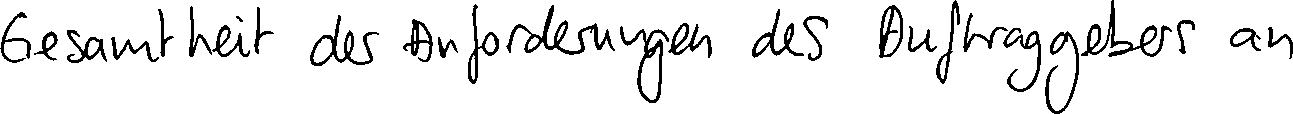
Gesamtheit der Anforderungen des Auftraggebers an
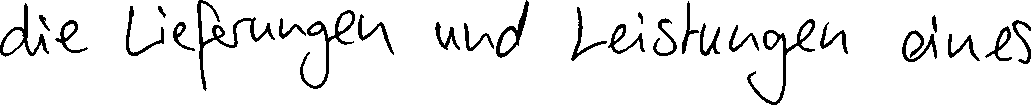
die Lieferungen und Leistungen eines
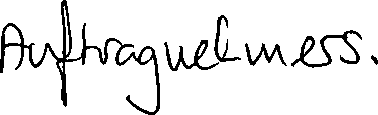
Auftragnehmers.
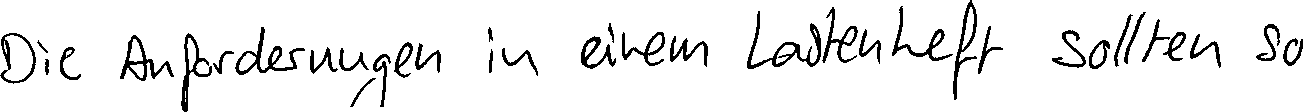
Die Anforderungen in einem Lastenheft sollten so
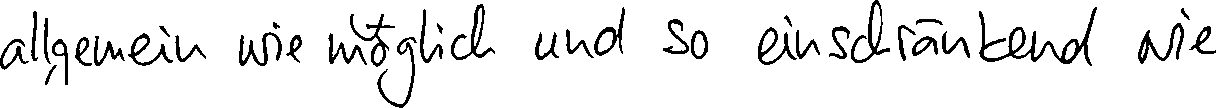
allgemein wie möglich und so einschränkend wie
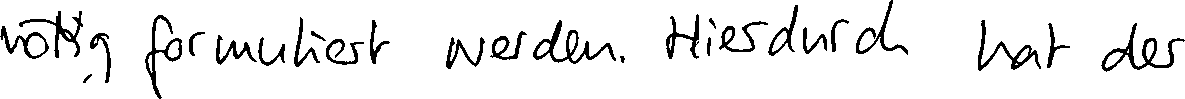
nötig formuliert werden. Hierdurch hat der
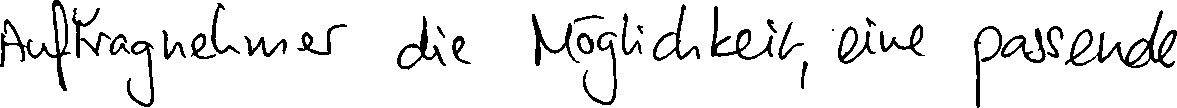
Auftragnehmer die Möglichkeit, eine passende
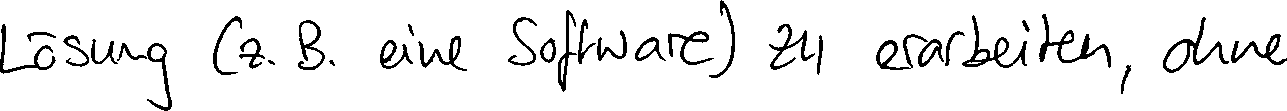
Lösung (z. B. eine Software) zu erarbeiten, ohne
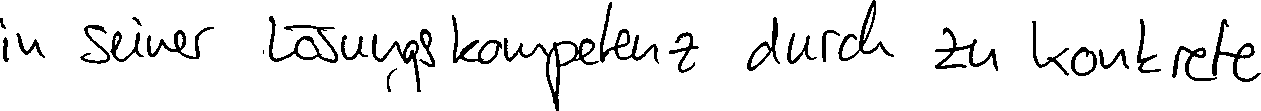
in seiner Lösungskompetenz durch zu konkrete
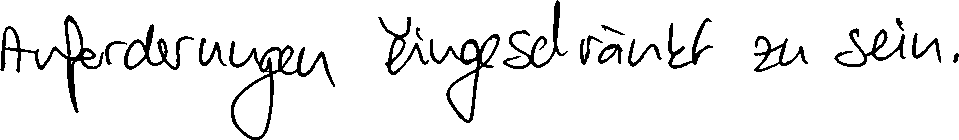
Anforderungen eingeschränkt zu sein.
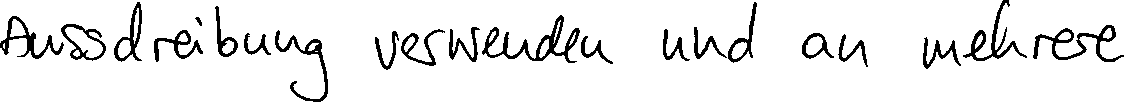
Ausschreibung verwenden und an mehrere
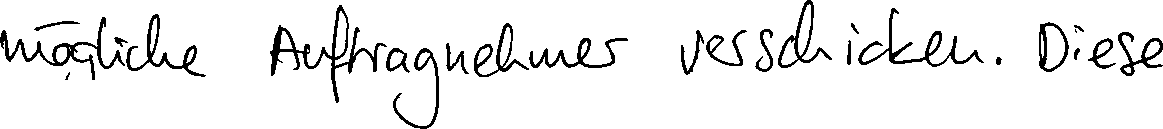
mögliche Auftragnehmer verschicken.
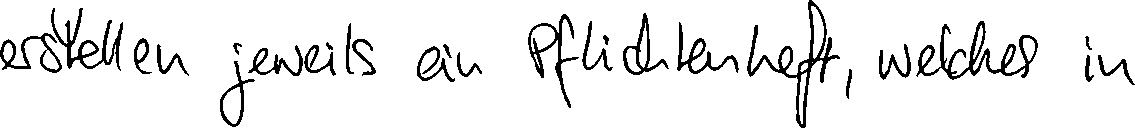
erstellen jeweils ein Pflichtenheft, welches in
